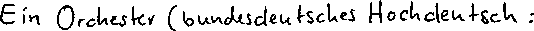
Ein Orchester (bundesdeutsches Hochdeutsch:
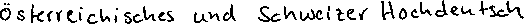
österreichisches und Schweizer Hochdeutsch
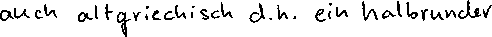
auch altgriechisch d.h. ein halbrunder
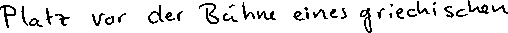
Platz vor der Bühne eines griechischen
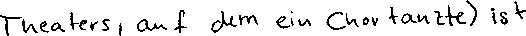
Theaters, auf dem ein Chor tanzte) ist
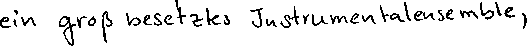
ein groß besetztes Instrumentalensemble,
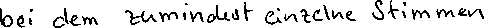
bei dem zumindest einzelne Stimmen
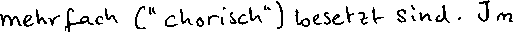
mehrfach ("chorisch") besetzt sind. Im
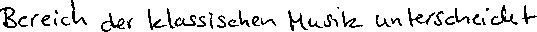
Im Bereich der klassischen Musik unterscheidet
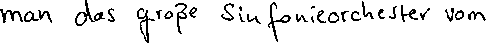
man das große Sinfonieorchester vom
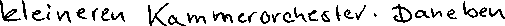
kleineren Kammerorchester. Daneben
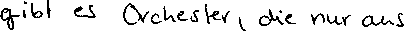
gibt es Orchester, die nur aus
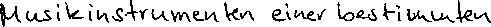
Musikinstrumenten einer bestimmten
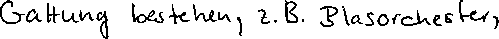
Gattung bestehen, z. B. Blasorchester,
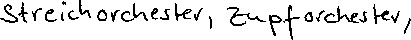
Streichorchester, Zupforchester,
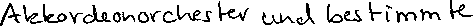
Akkordeonorchester und bestimmte
